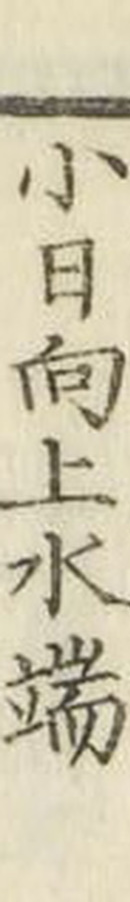小日向上水端
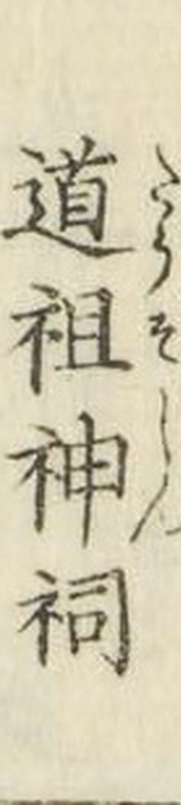道祖神祠

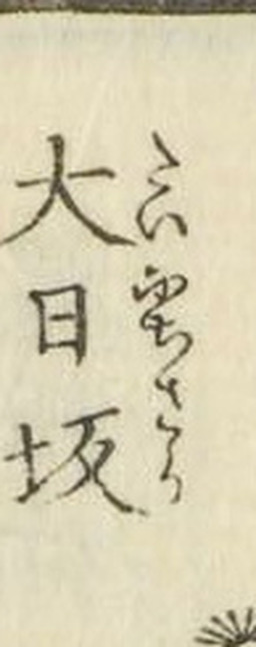大日坂
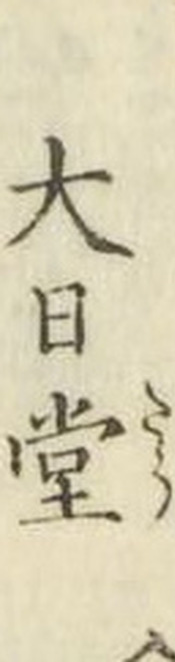大日堂
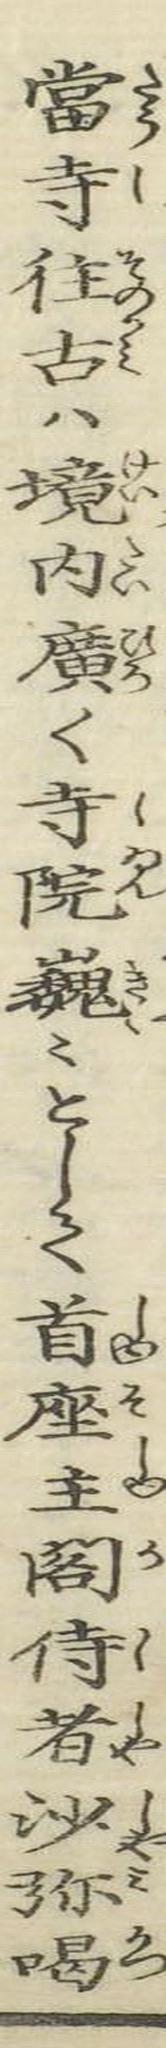當寺往古は境内廣く寺院巍々として首座主閣侍者沙弥喝
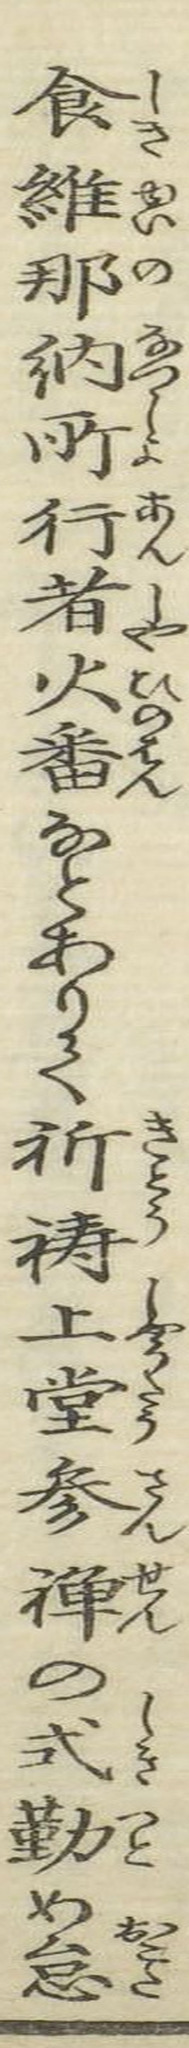食維那納所行者火番なとありて祈祷上堂参禅の式勤め怠
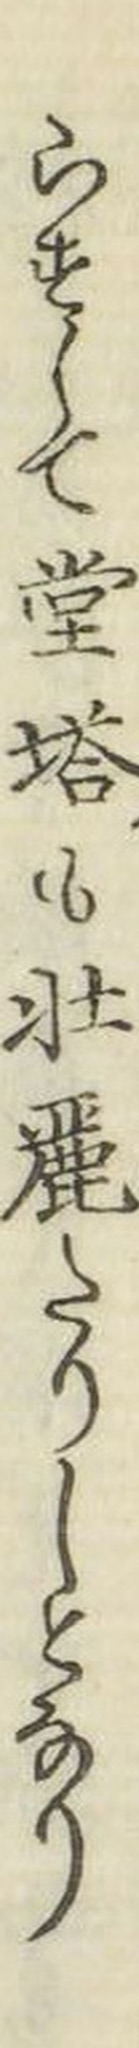らすして堂塔も壮麗たりしとなり
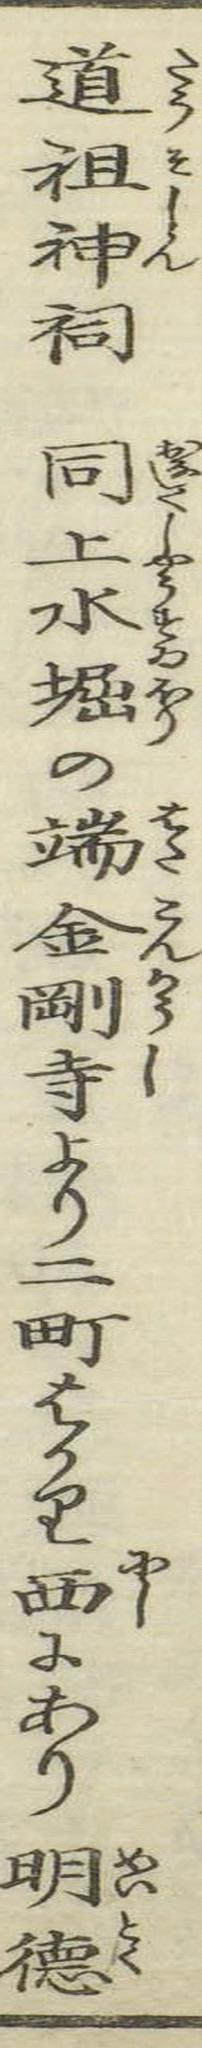道祖神祠同上水堀の端金剛寺より二町はかり西にあり明德
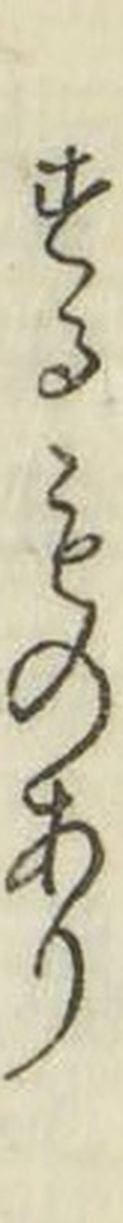するものあり
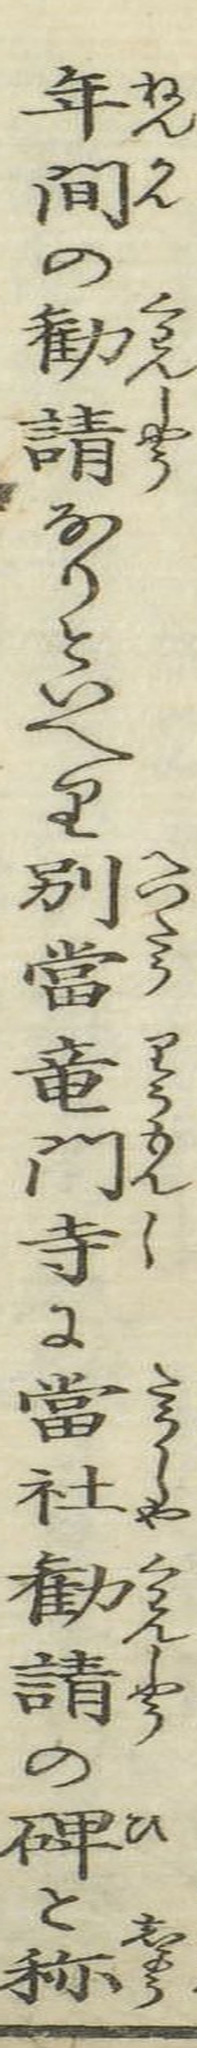年間の勧請なりといへり別當竜門寺に當社勧請の碑と称
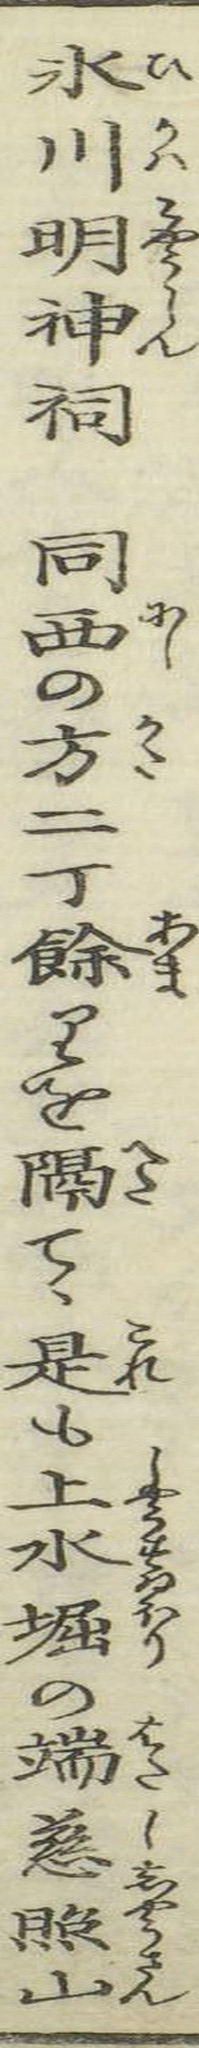氷川明神祠同西の方二丁餘りを隔てゝ是も上水堀の端慈照山
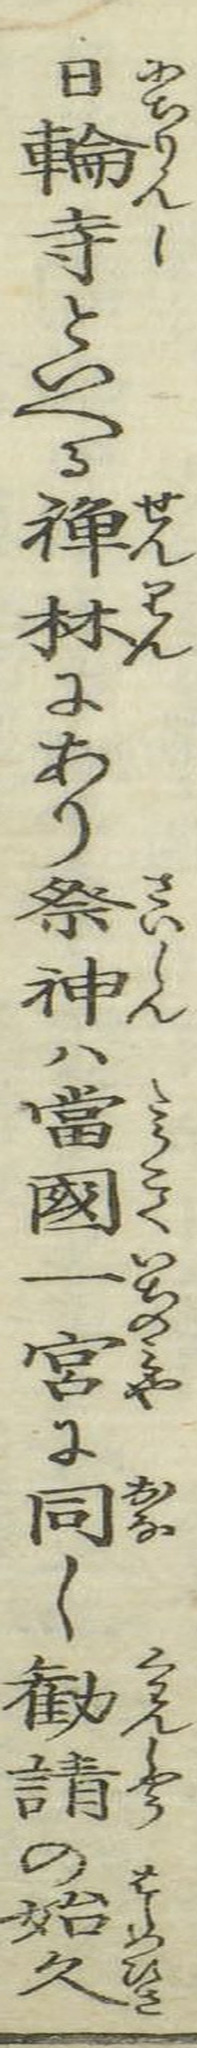日輪寺といへる禅林にあり祭神は當國一宮に同し勧請の始久
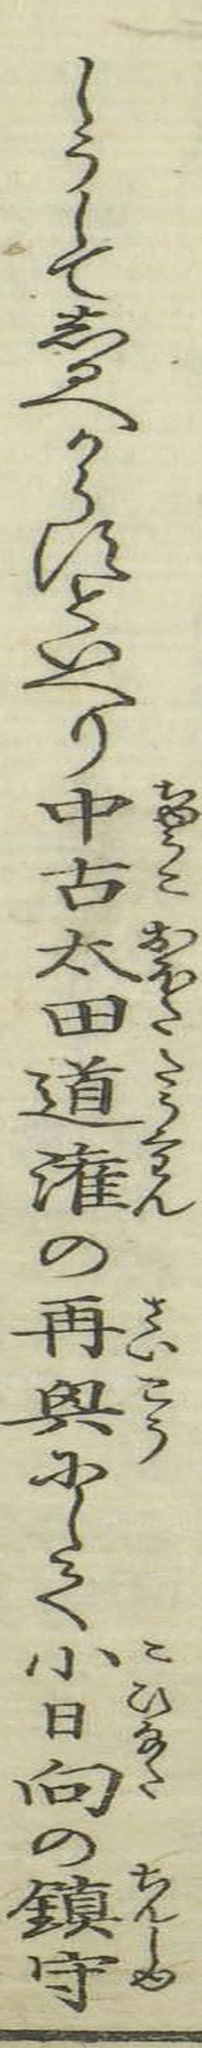しうしてしるへからすといへり中古太田道灌の再興にして小日向の鎮守

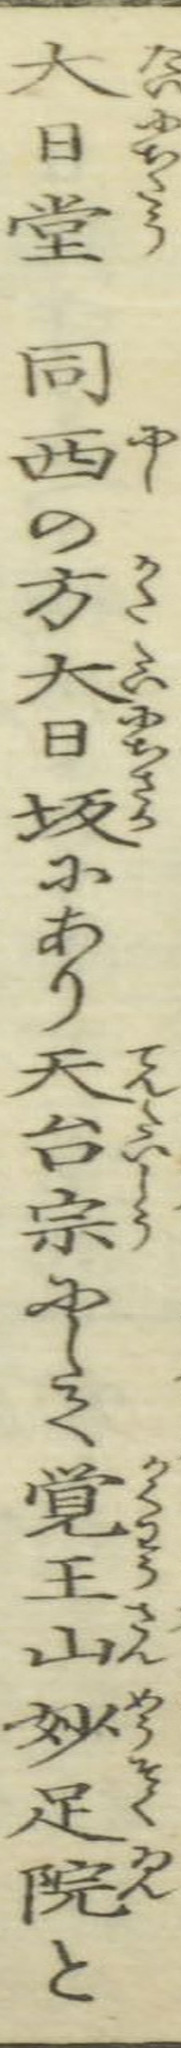大日堂同西の方大日坂にあり天台宗にして覚王山妙足院と
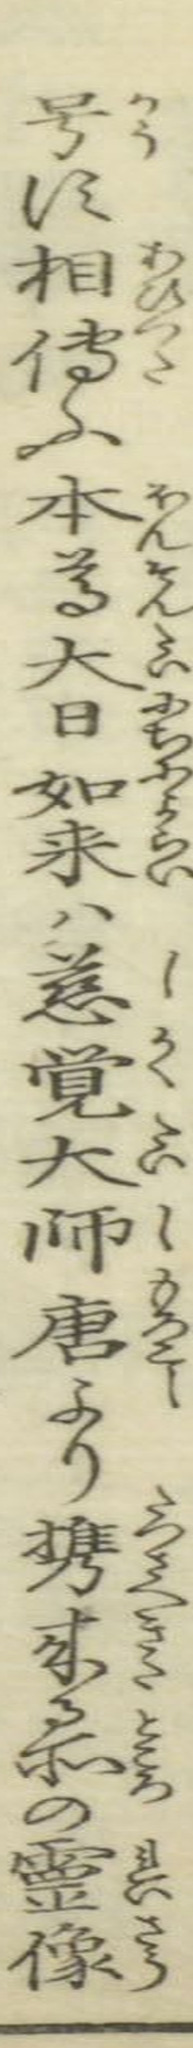号す相傳ふ本尊大日如来は慈覚大師唐より携来る所の霊像
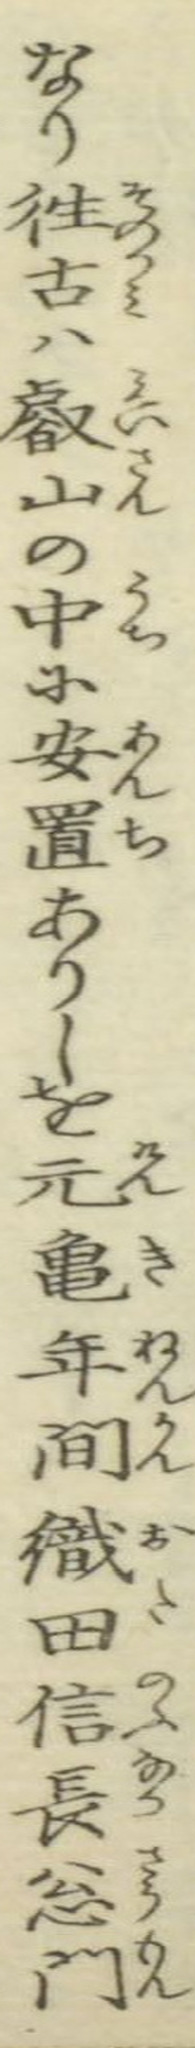なり往古は叡山の中に安置ありしを元亀年間織田信長忩門
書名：江戸名所図会 20巻 巻之12
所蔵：東京学芸大学教育コンテンツアーカイブ
